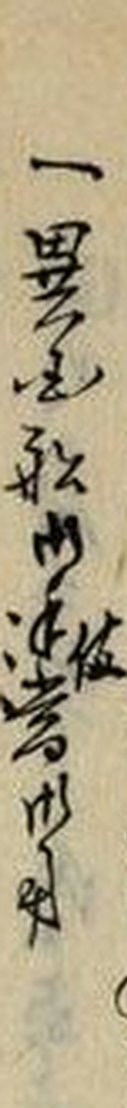一異国船御手当御用
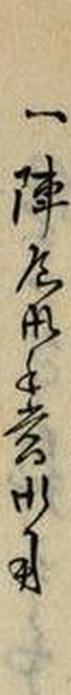一陣屋御手当御用
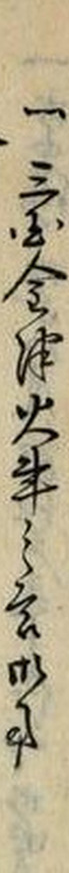一三国金津火事之節御用
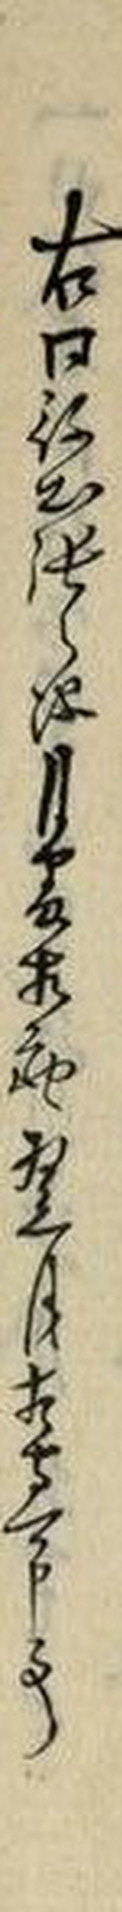右同役出張之儀月番相勤候翌月相守可申事
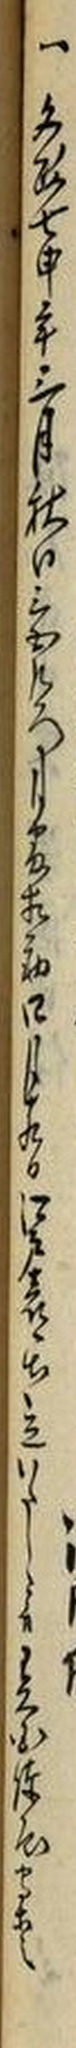一文政七申年三月秋田三五左衛門月番相勤四月十九日江戸表へ出立いたし候ニ付異国陣屋守等之
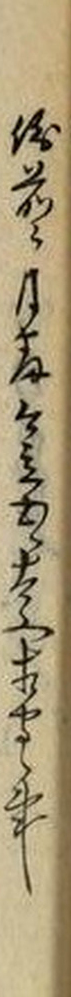儀前々月番今立五郎太夫相守候事
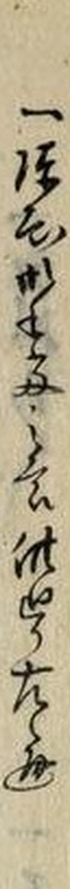一陣屋御手当之節供廻り左之通
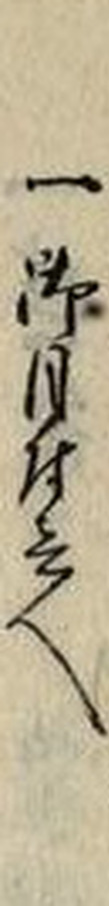一御目付壱人
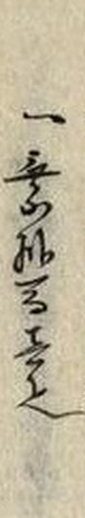一乗掛馬壱疋
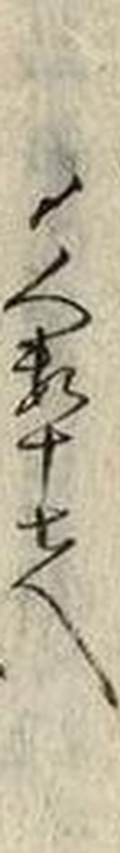〆人数十七人
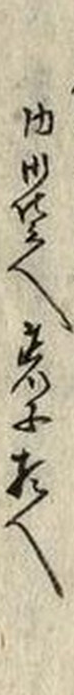内御貸人荒子拾人
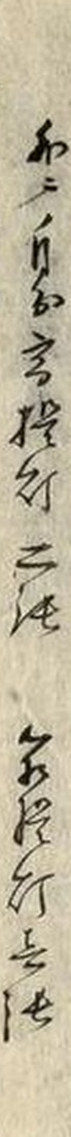外ニ自分高提灯二張箱提灯壱張
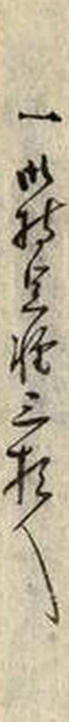一御持足軽三拾人
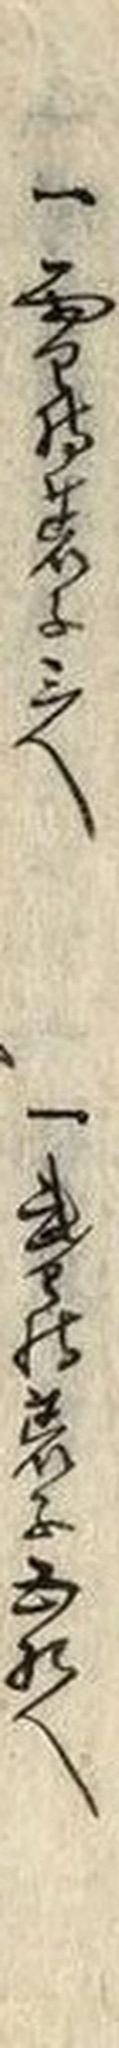一雨具持荒子三人一武具持荒子五拾人
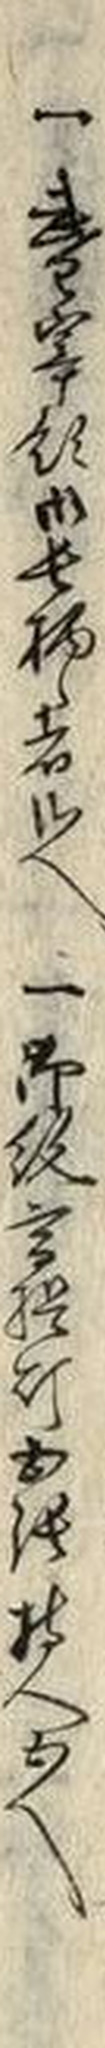一武具宰領御長柄之者弐人一御紋高提灯五張持人五人
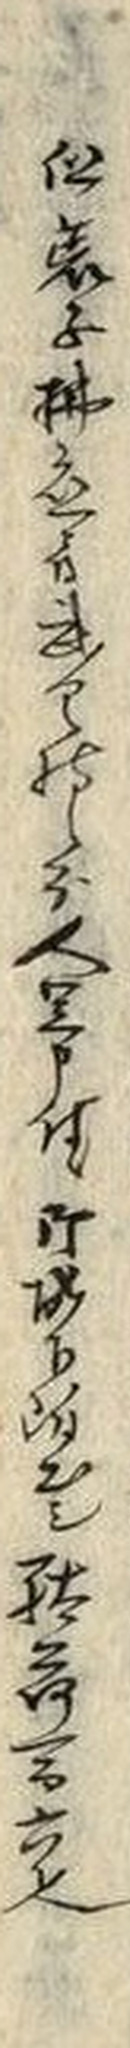但荒子払底ニ付武具持之分人足申付候御城下附出シ駄荷馬六疋
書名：御国他国諸事之部
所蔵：福井県文書館 Fukui Prefectural Archives
